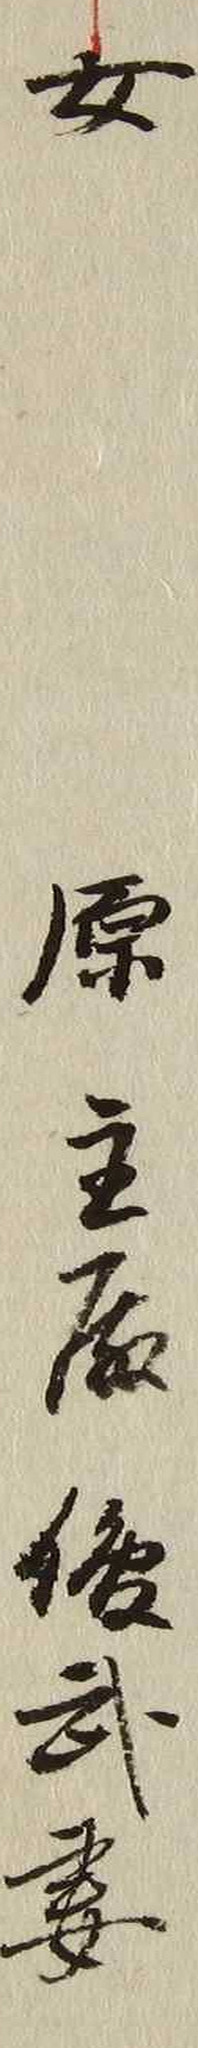女原主殿俊武妻
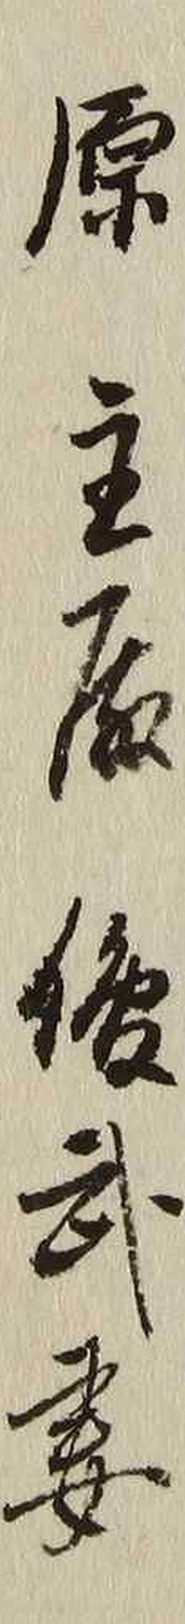女原主殿俊武妻
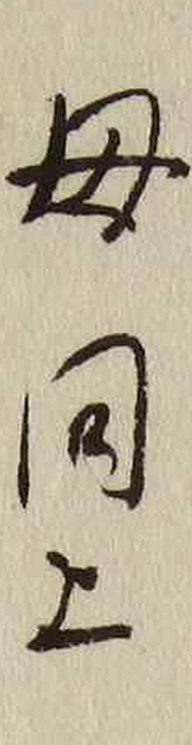母同上
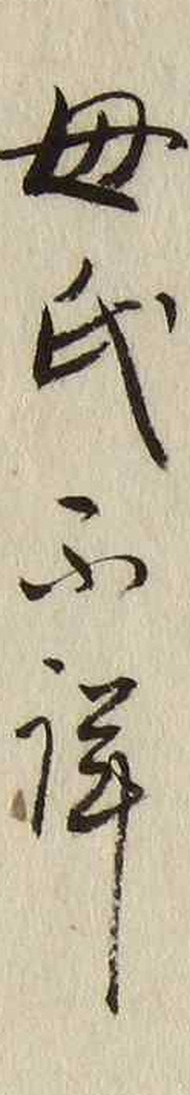母氏不詳
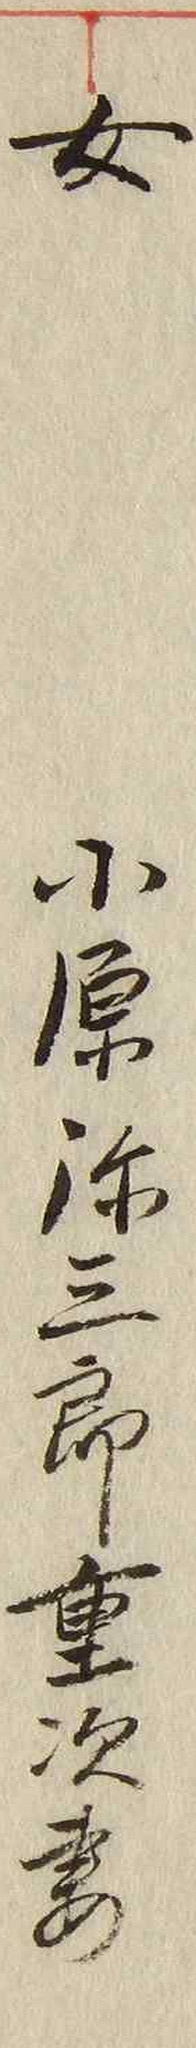女小原弥三郎重次妻
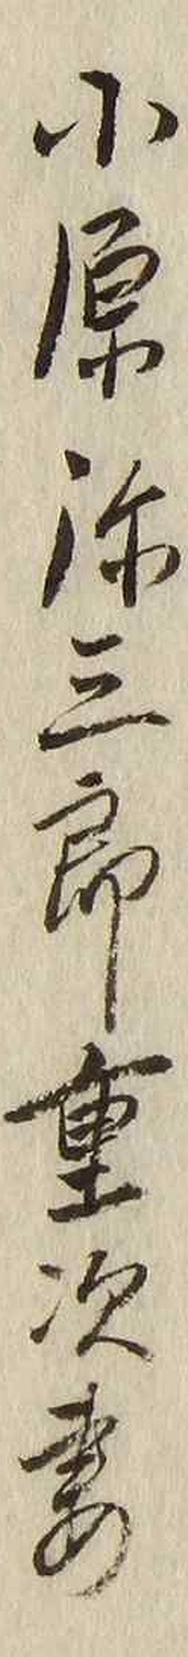女小原弥三郎重次妻

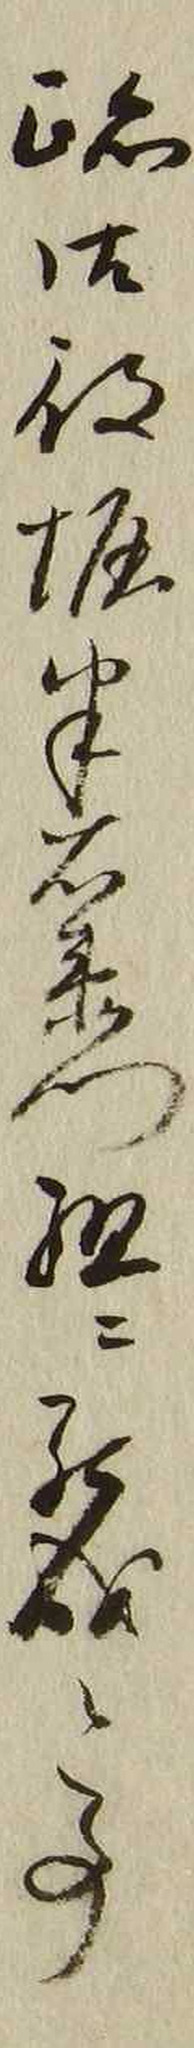跡御役堀半右衛門組ニ罷成候事
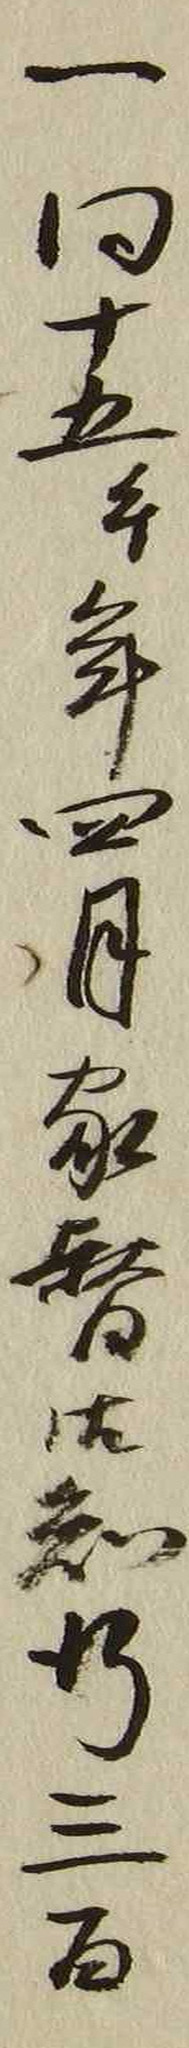一同十五午年四月家督御知行三百
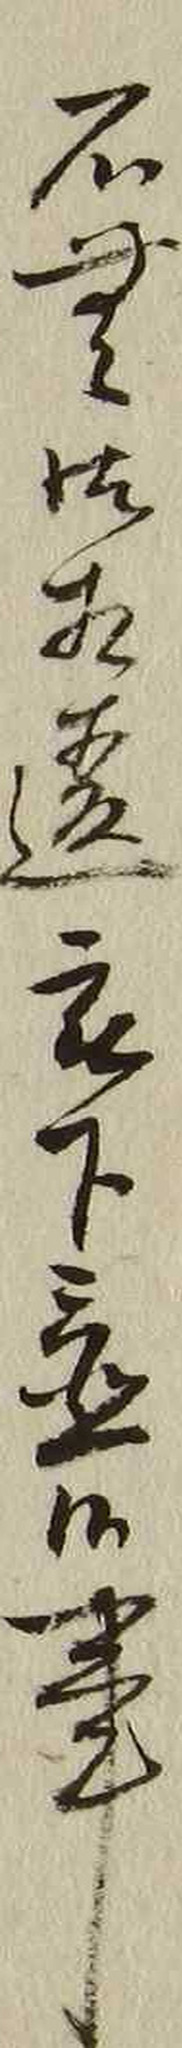石無御相違被下置候事
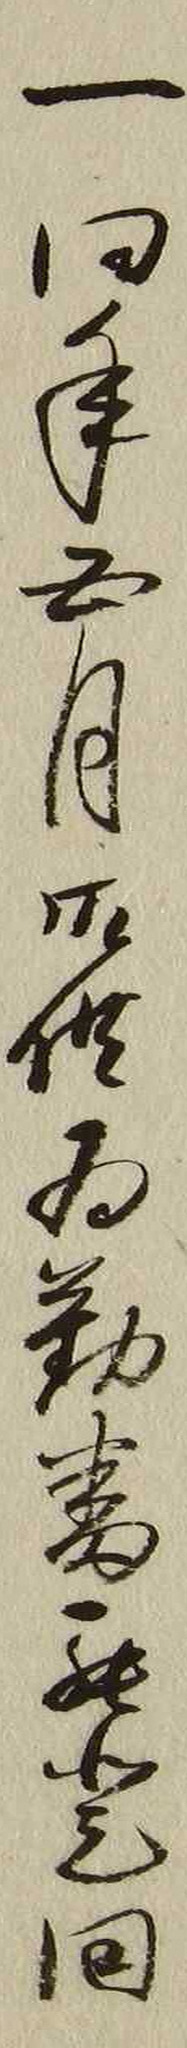一同年五月御供為勤番罷登同
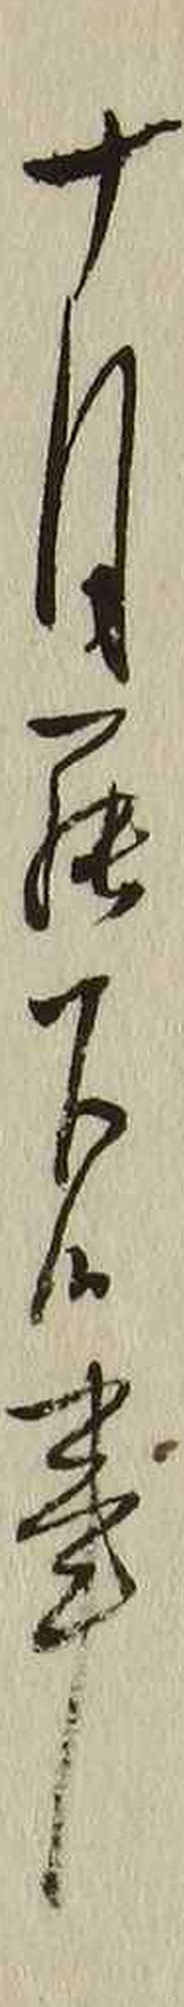十月罷下候事
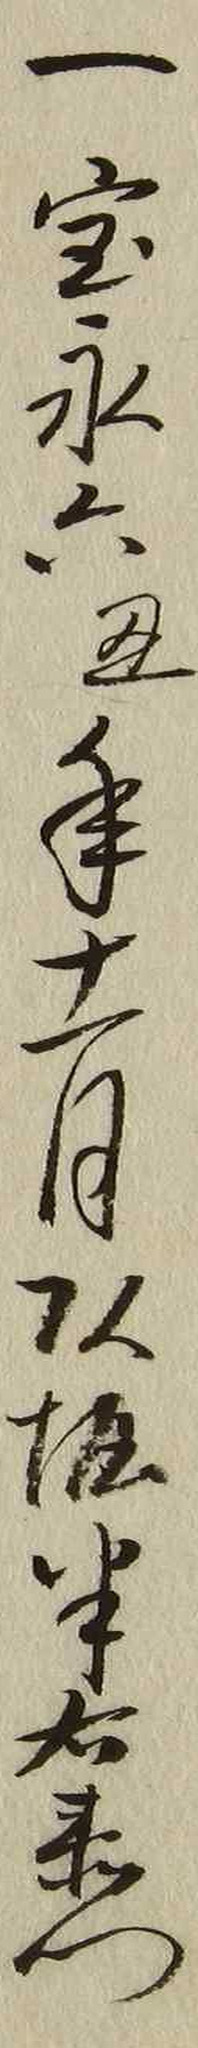一宝永六丑年十一月頭堀半右衛門
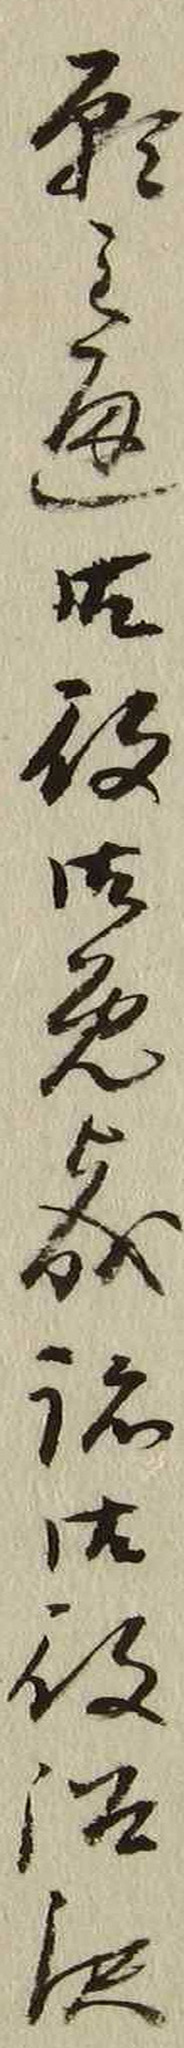願之通御役御免被成跡御役沼沢
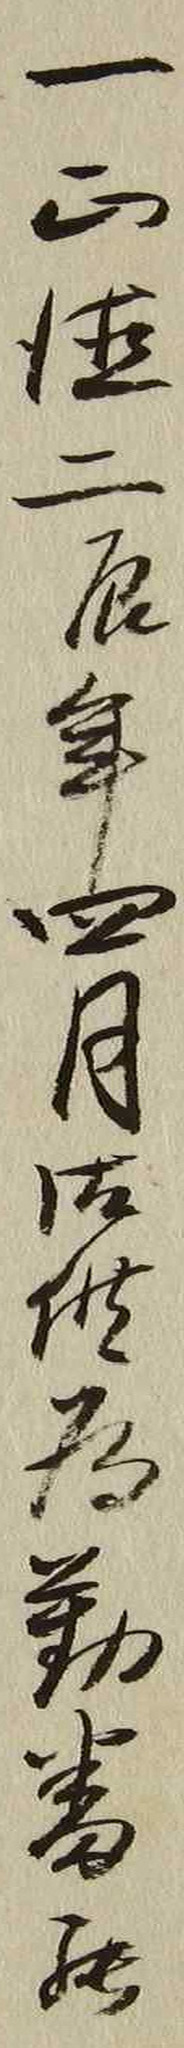一正徳二辰年四月御供為勤番罷
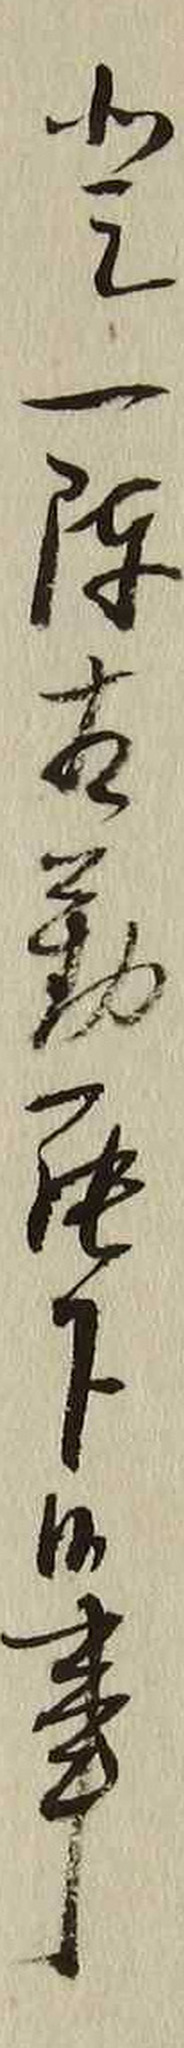登一陣相勤罷下候事
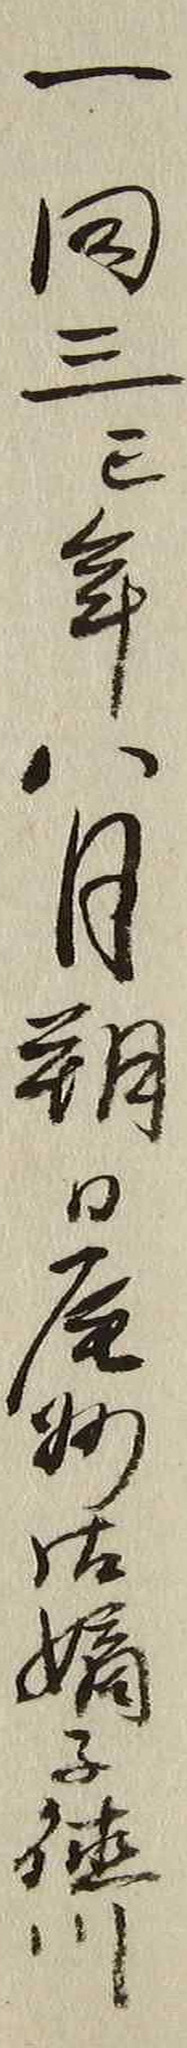一同三巳年八月朔日尾州御嫡子徳川
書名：諸士系譜　巻之356　す之部6
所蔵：会津若松市立会津図書館
